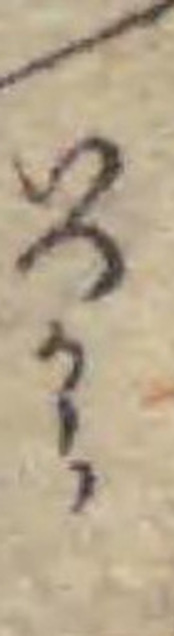いつから
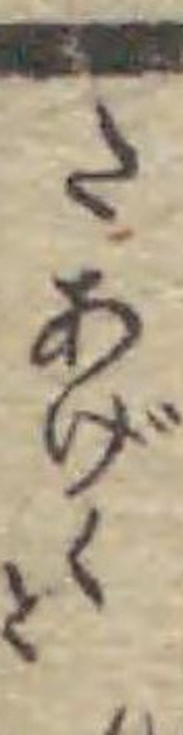たあげくと
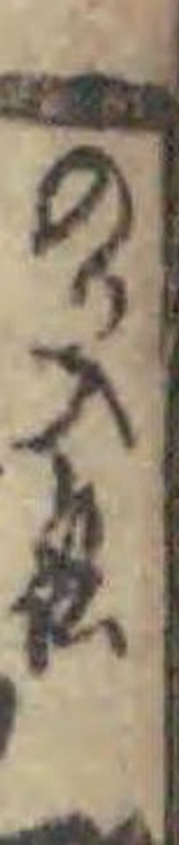のり入絵
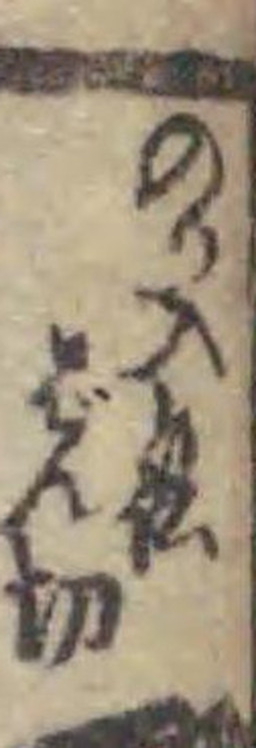ばん切
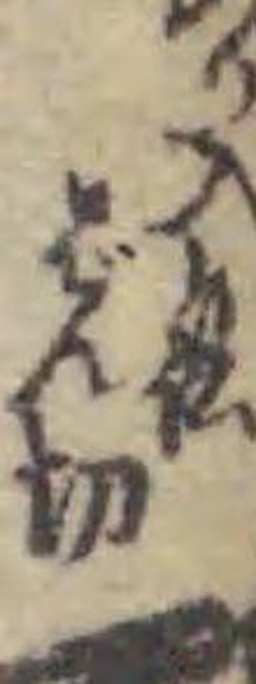ばん切
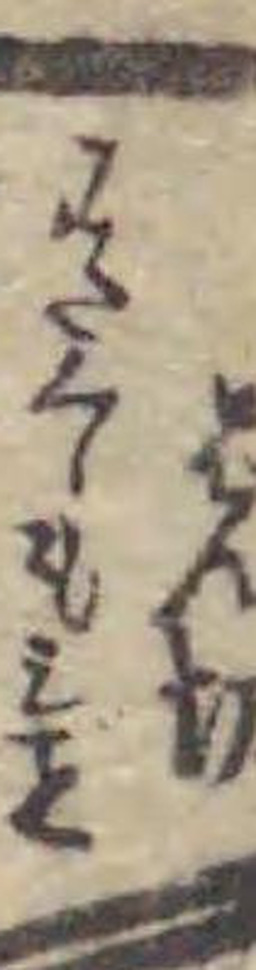わたくしもみこと
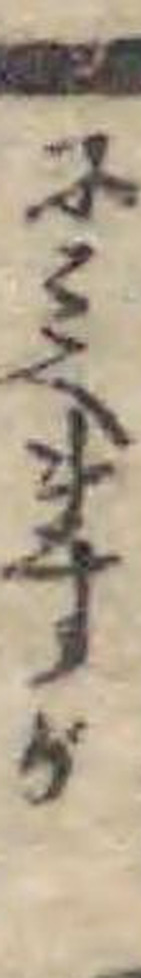にみへますが
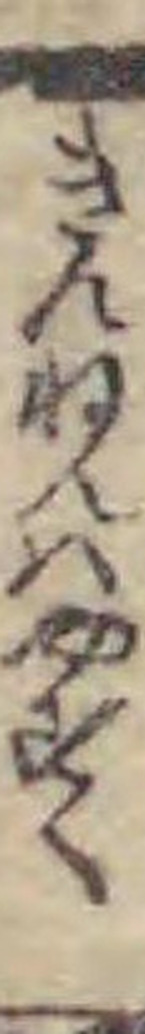きんねんはやすく
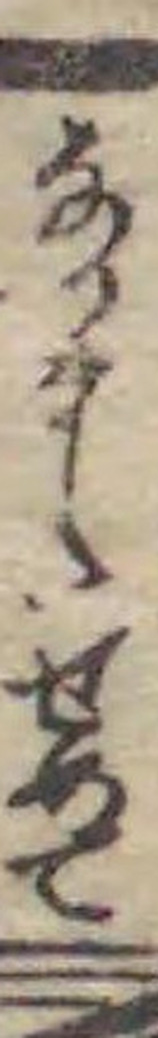なりましたせめて
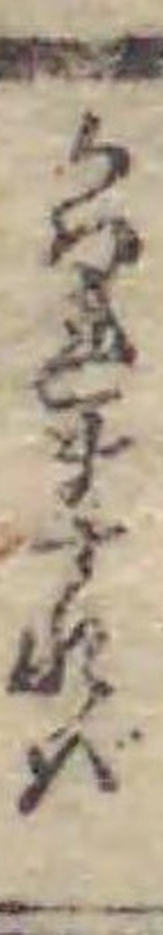かはれますれば
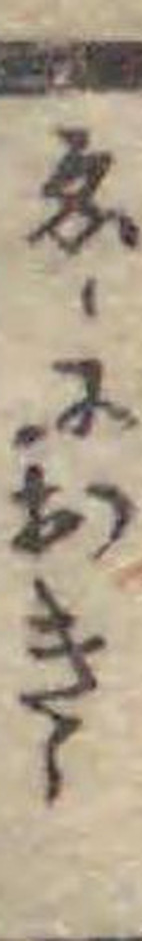ゑゝにおきゝ
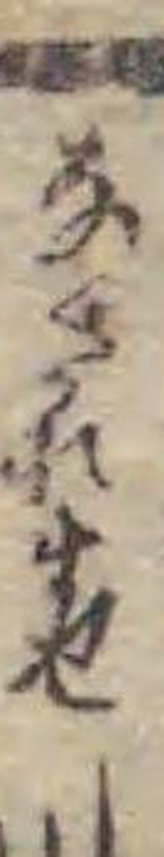なされませ
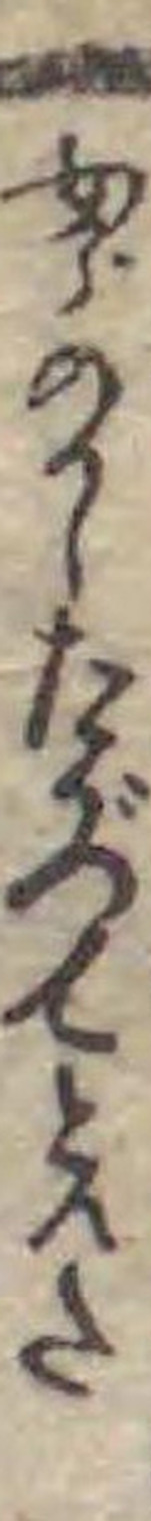女郎のかしたがつてとんた
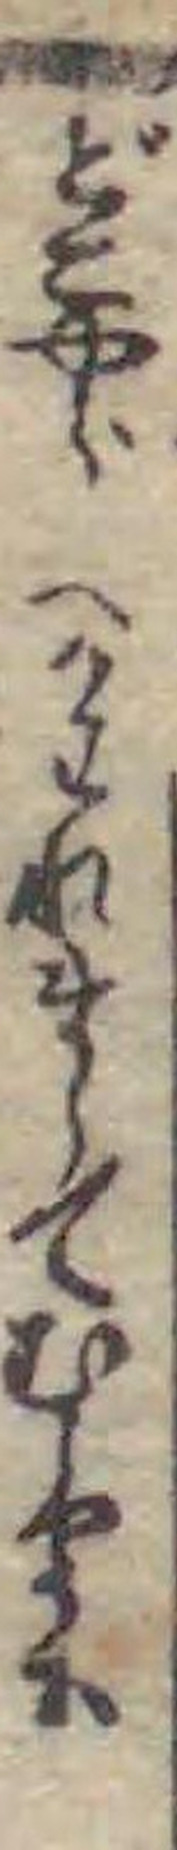どこやらへかわれましてむしやうに
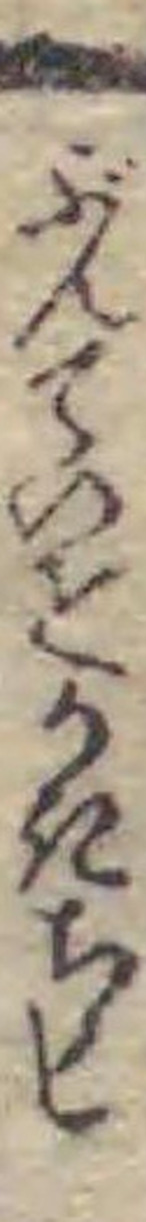ぶんていをかきちらし
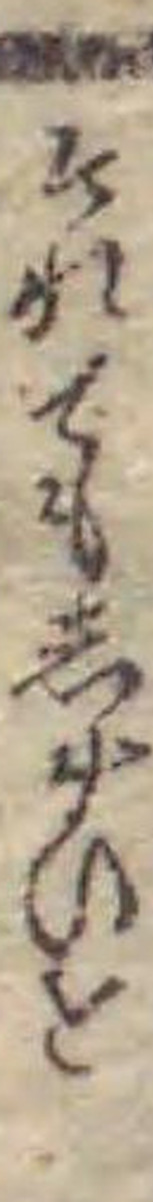それてもしまひと
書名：紙屑身上噺 : 3巻
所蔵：国立国会図書館 National Diet Library, JAPAN
